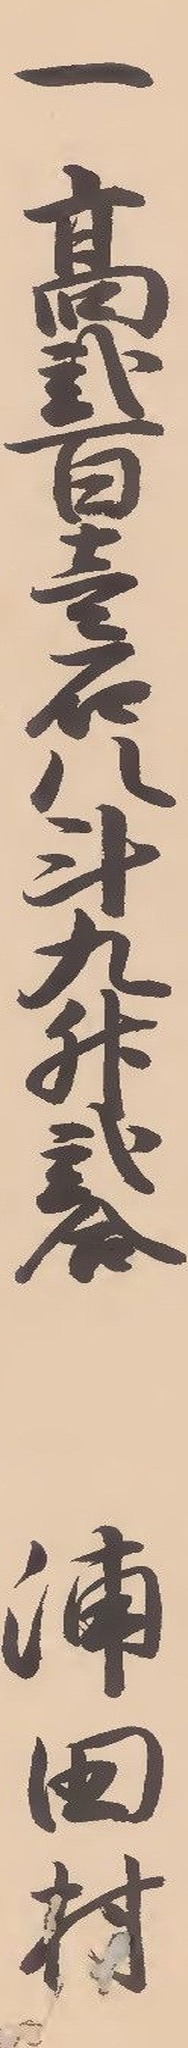一高弐百壱石八斗九升弐合浦田村
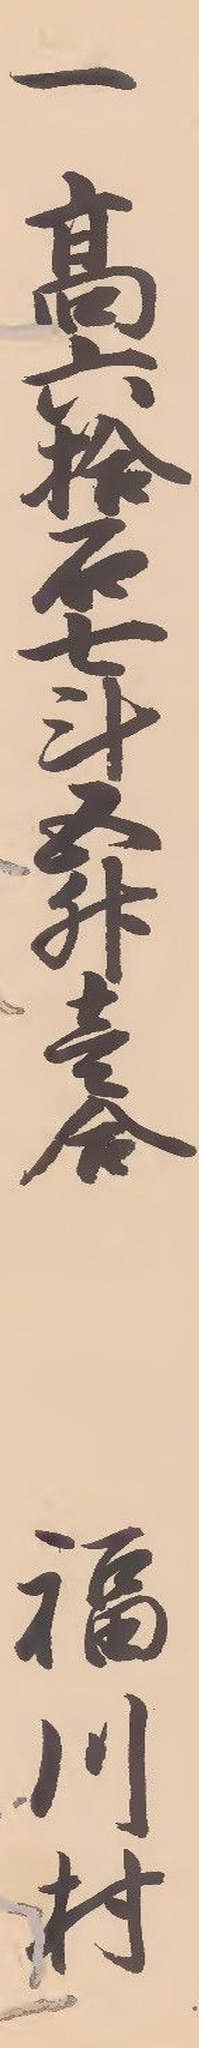一高六拾石七斗五升壱合福川村

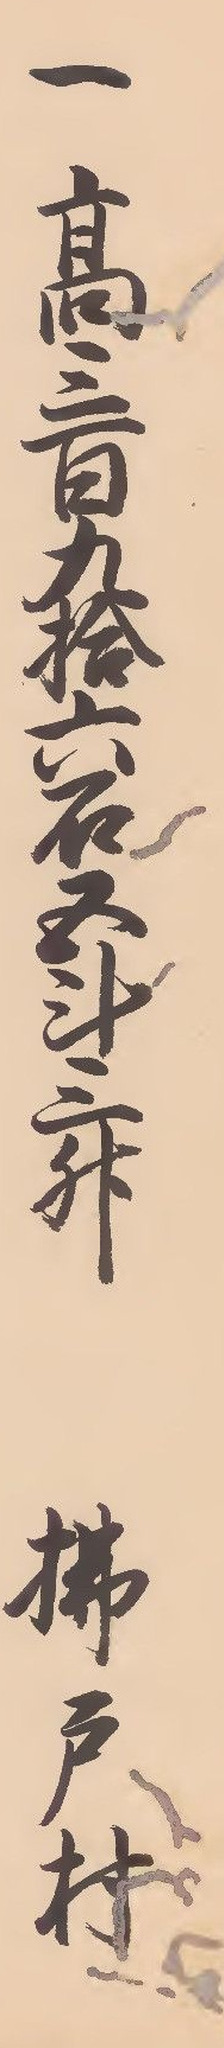一高三百九拾六石五斗三升払戸村
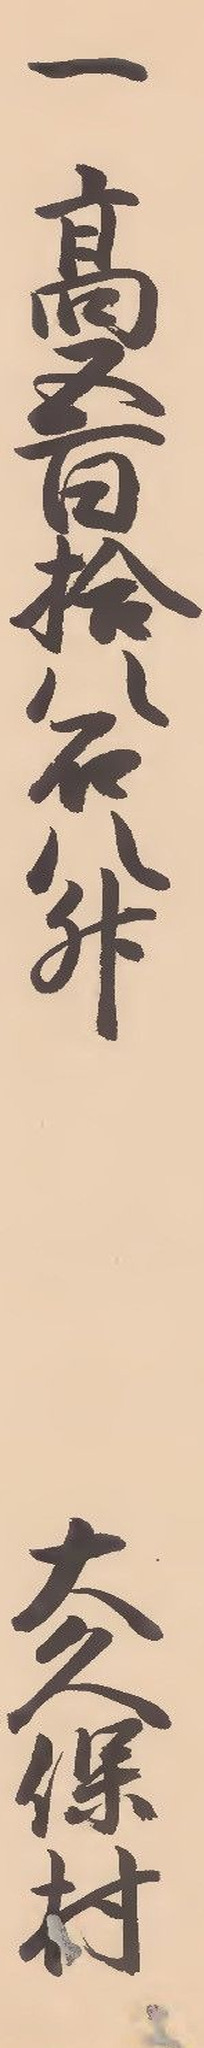一高五百拾八石八升大久保村
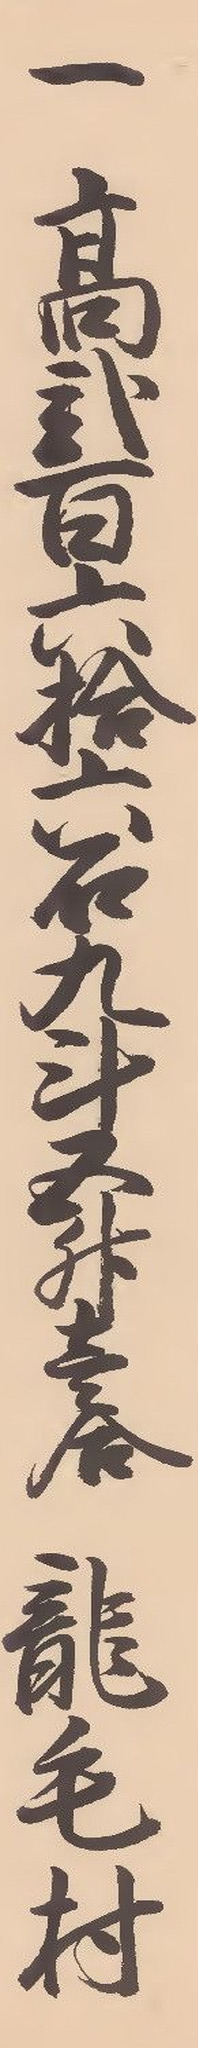一高弐百六拾六石九斗五升壱合竜毛村
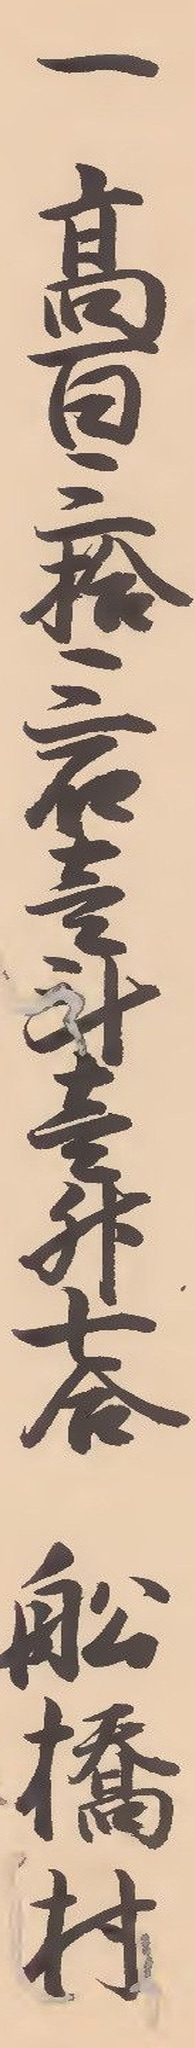一高百三拾三石壱斗壱升七合船橋村
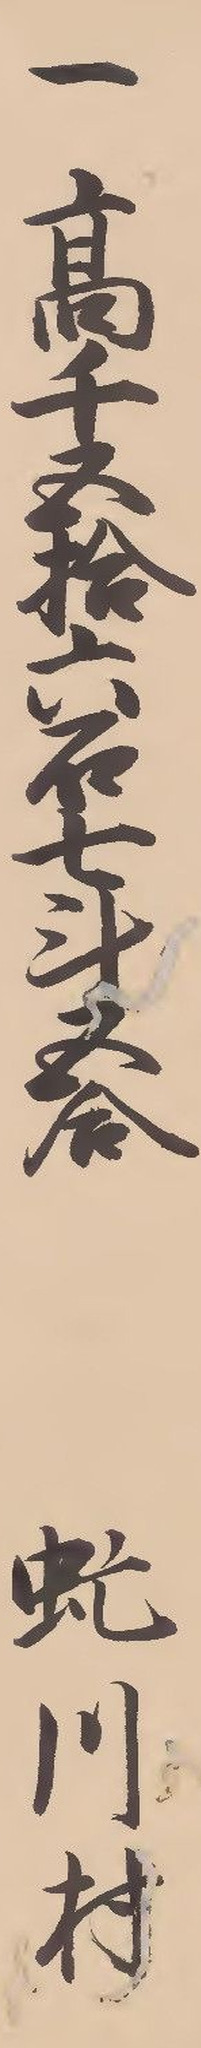一高千五拾六石七斗五合虻川村
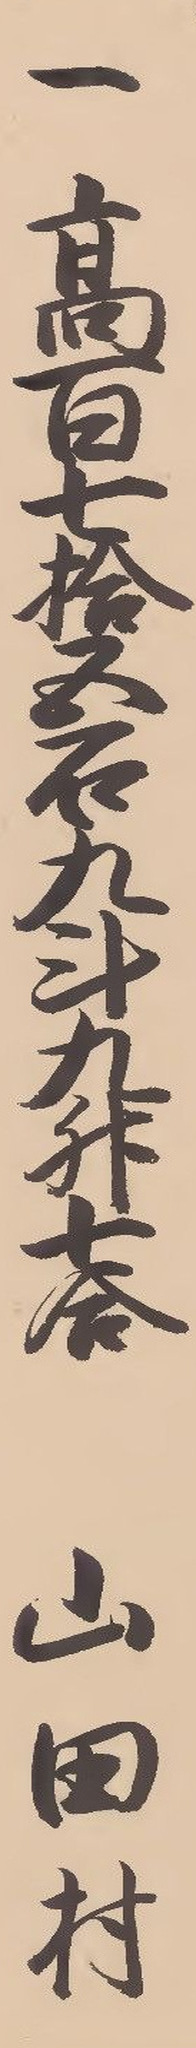一高百七拾五石九斗九升七合山田村
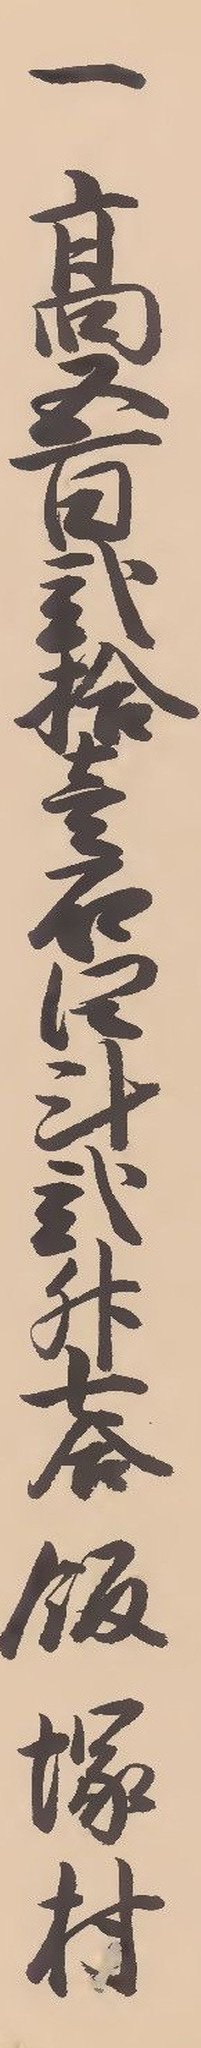一高五百弐拾壱石四斗弐升七合飯塚村
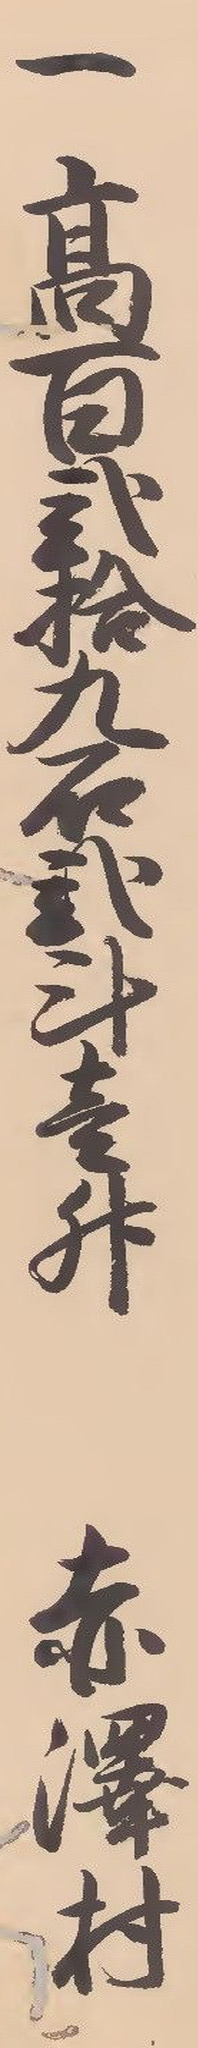一高百弐拾九石弐斗壱升赤沢村

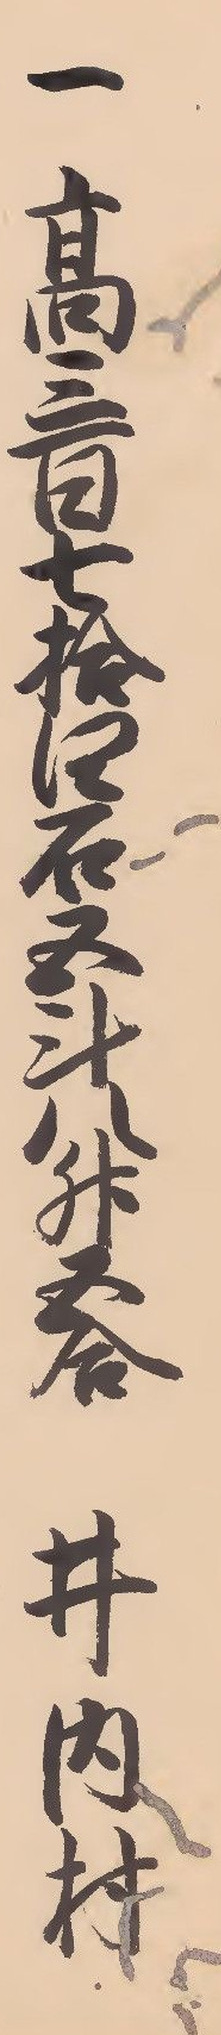一高三百七拾四石五斗八升五合井内村
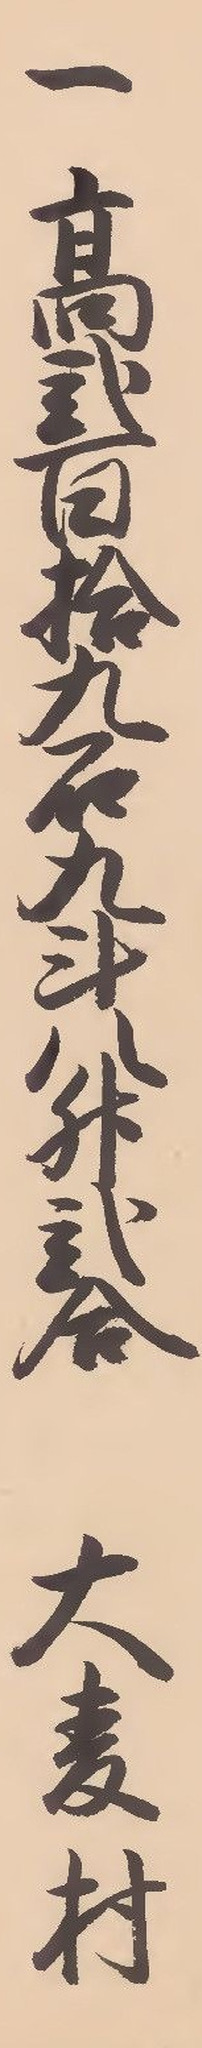一高弐百拾九石九斗八升弐合大麦村
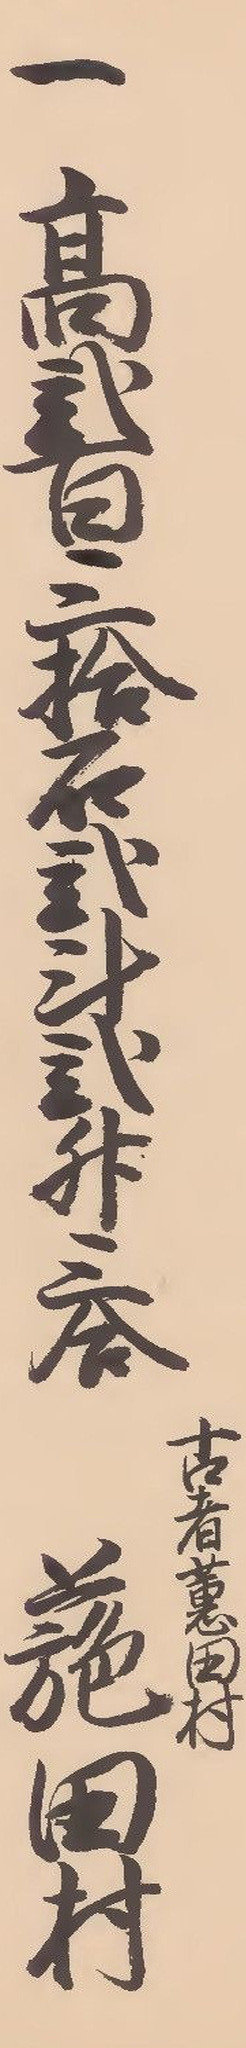一高弐百三拾石弐斗弐升三合葹田村
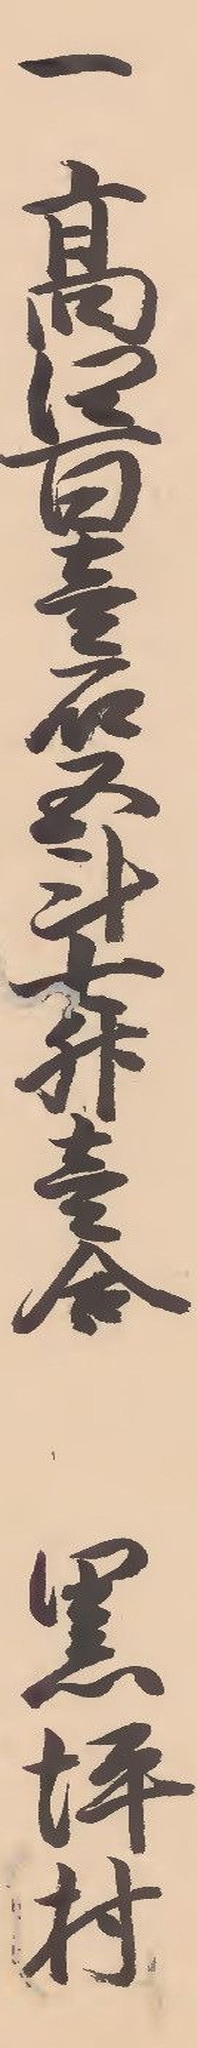一高四百壱石五斗七升壱合黒坪村
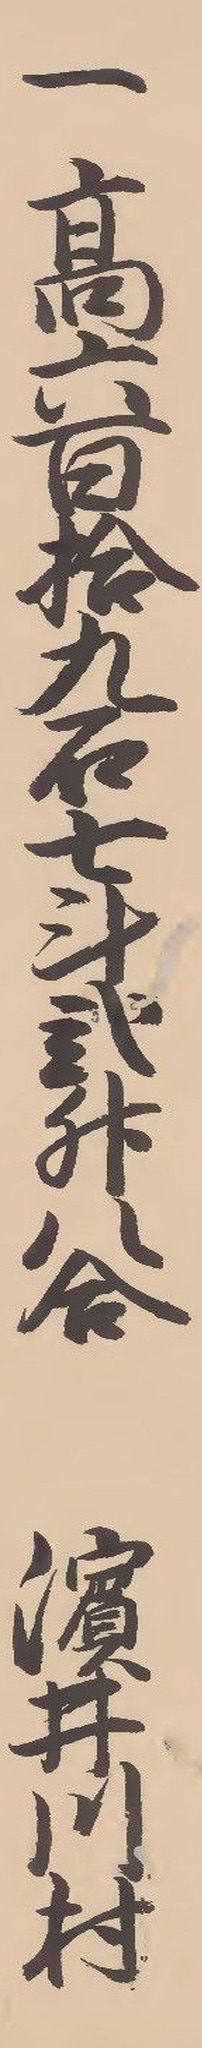一高六百拾九石七斗弐升八合浜井川村
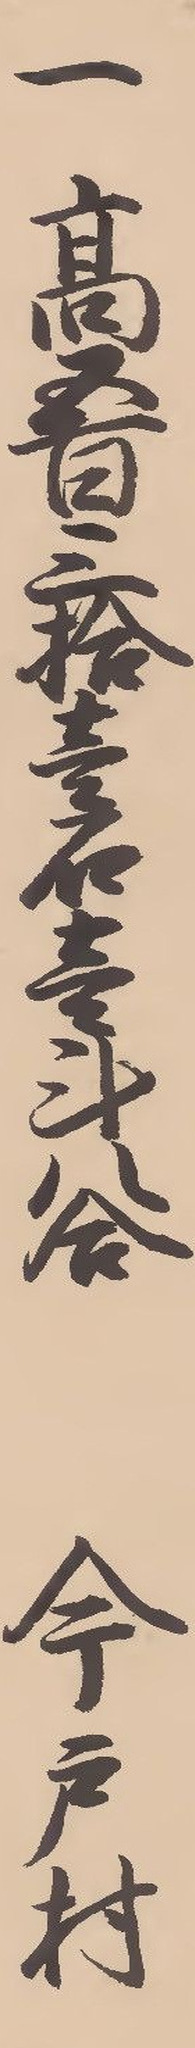一高五百三拾壱石壱斗八合今戸村
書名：出羽国郷帳　５
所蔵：国立公文書館 National Archives of Japan
